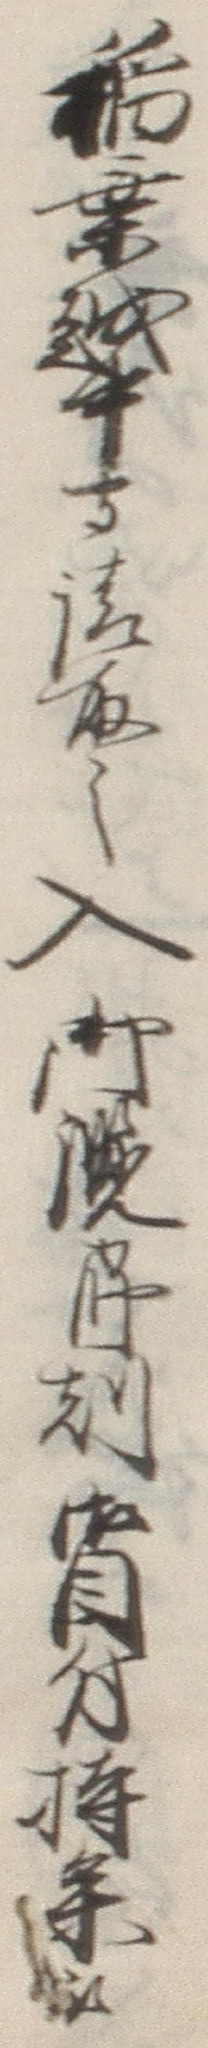稲葉越中守請取之入御覧即刻御目付持参被
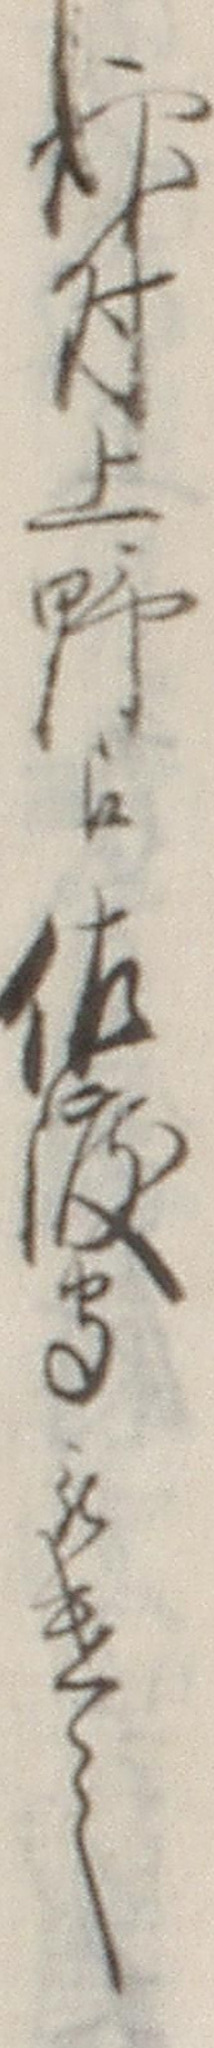仰付上野え佐渡守被遣之
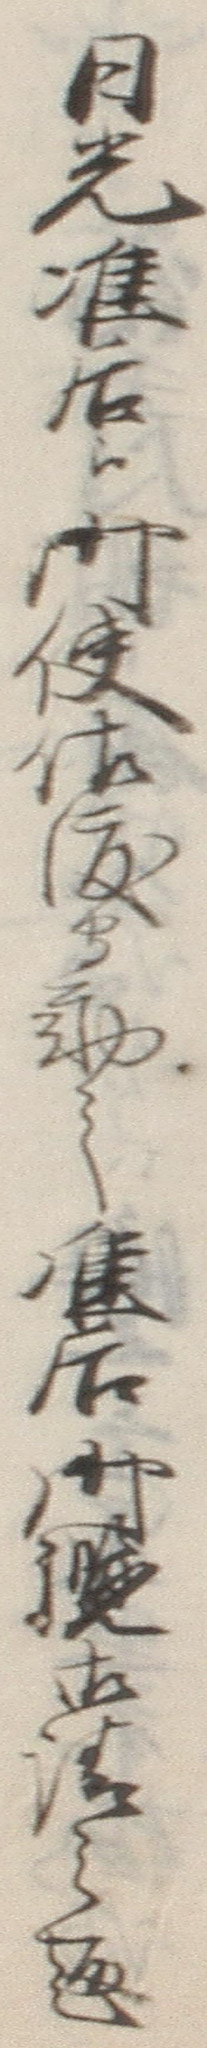日光准后え御使佐渡守勤之准后御覧御請之趣
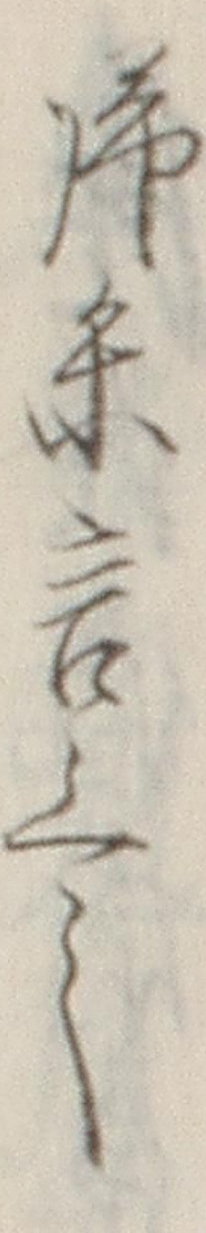帰参言上之
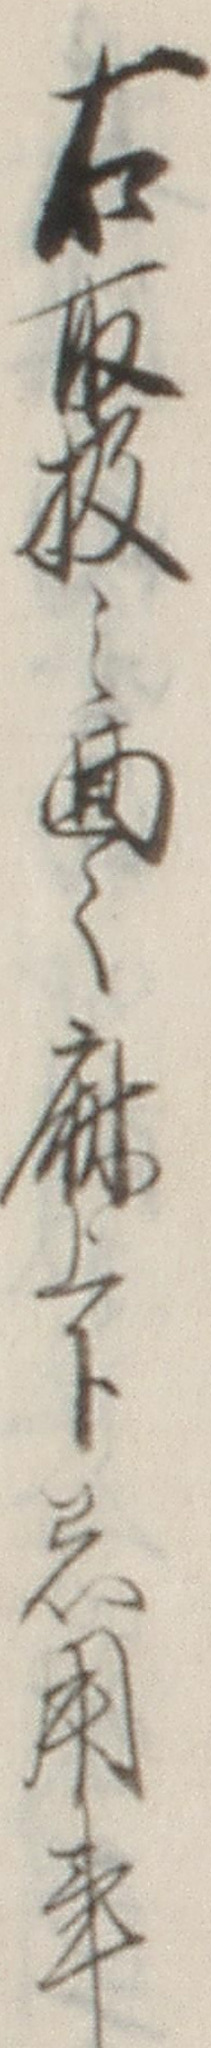右取扱之面々麻上下着用事

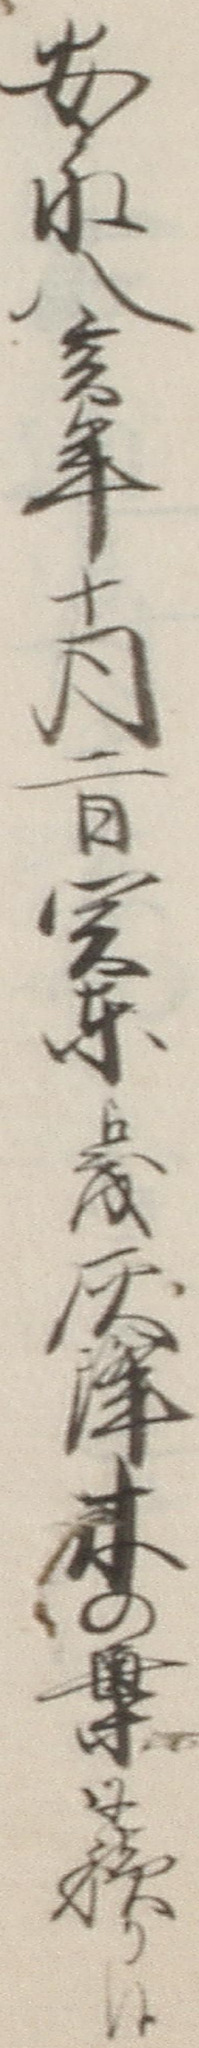安永八亥年十月二日関東えも灰降木の葉に積り候
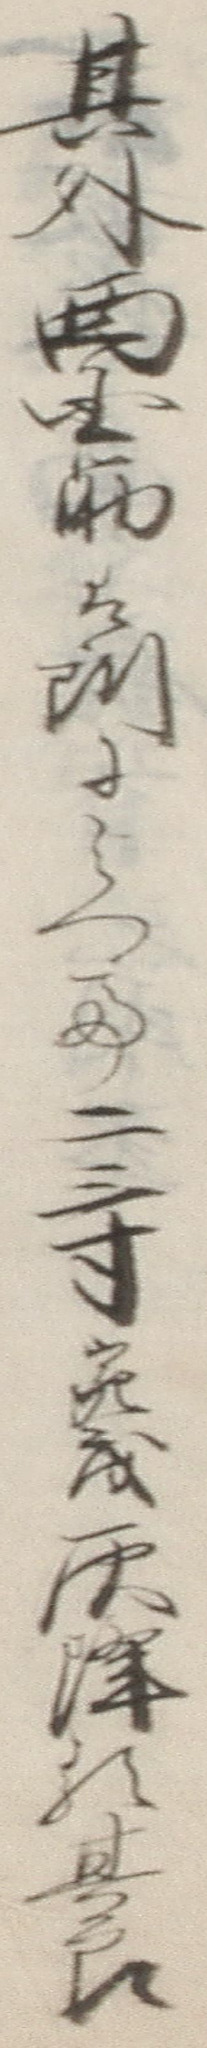其外西国筋は所によつて二三寸宛も灰降る其節
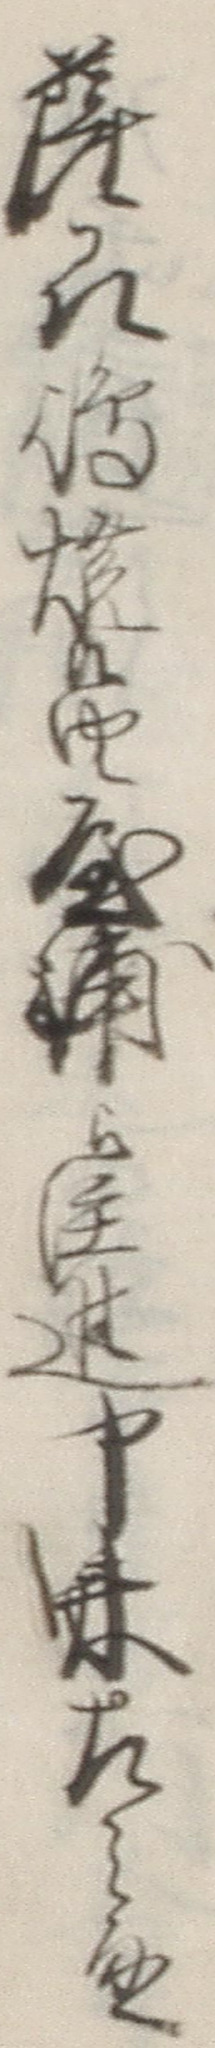薩州嶋焼候由屋鋪え注進申来左の通
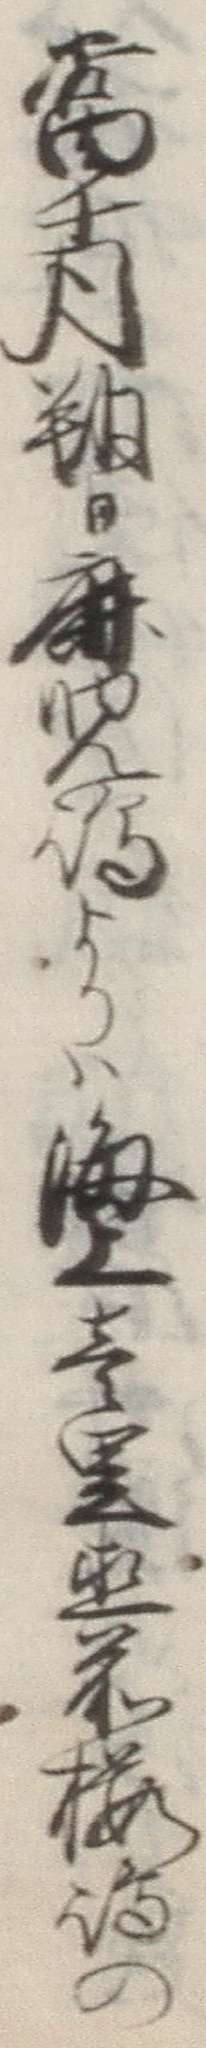当十月朔日鹿児島よりハ海上壱里直前桜島の
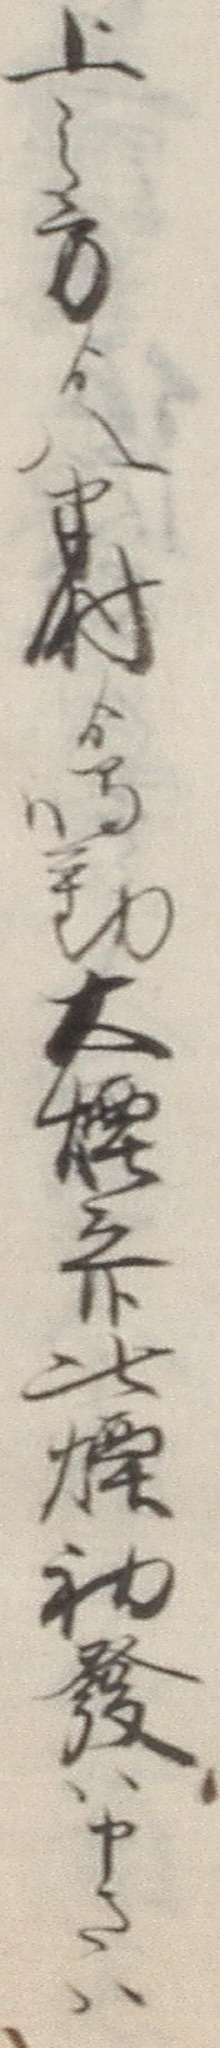上之方ゟ八半時ゟ鳴動大煙立候此煙初発ハ申さハ
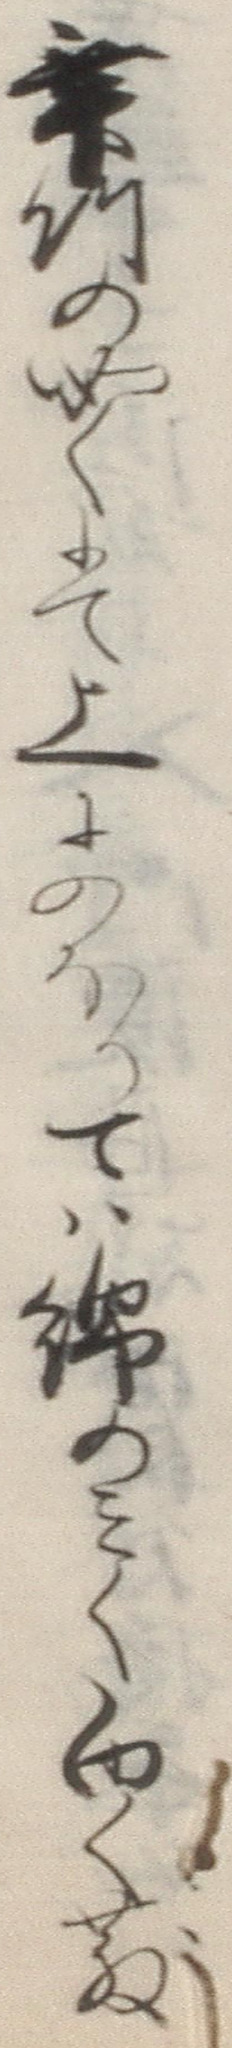葉竹の如くにて上にのほりてハ綿のことく白く散
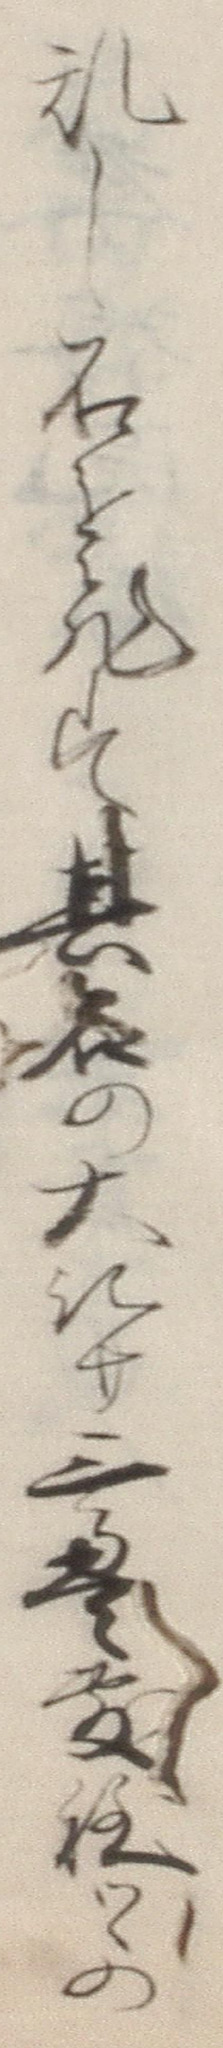乱し石を飛す其岩の大きさ三畳敷程ツヽの
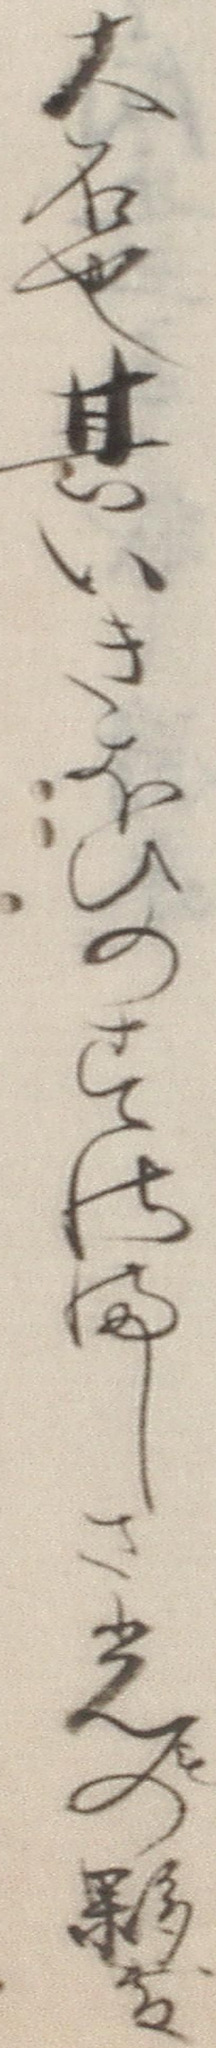大石也其いきほいのすさましさ光の夥敷
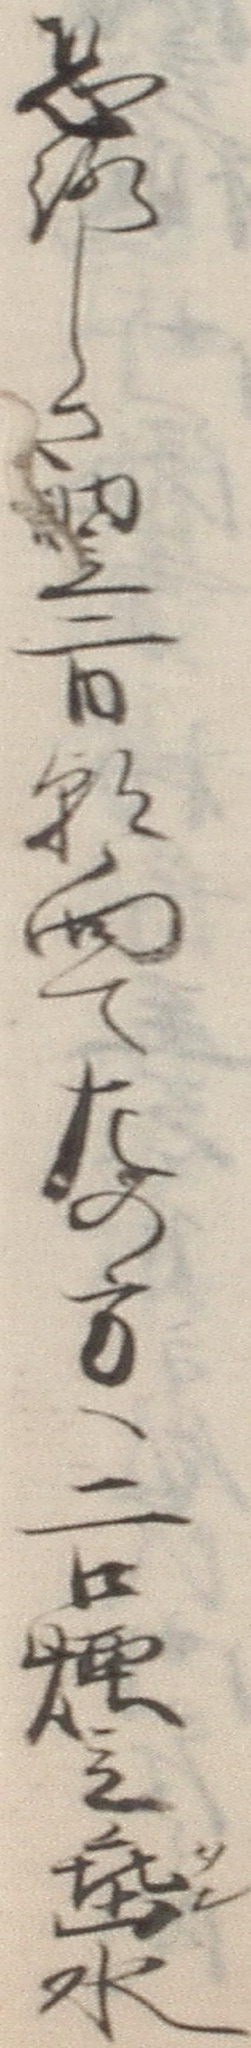恐ろしさ翌二日朝向て左の方へ二口煙立垂水
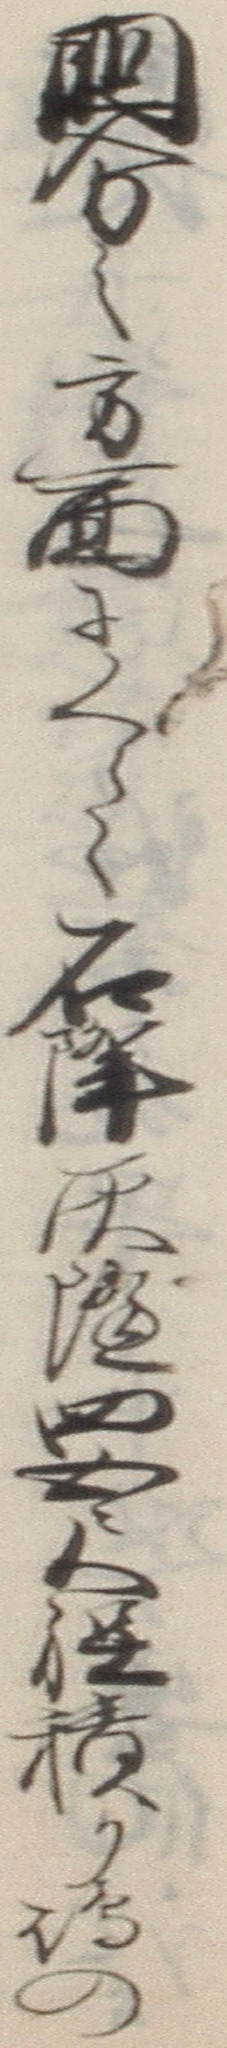国分の方一面にくらく石降灰降四五尺程積り嶋の
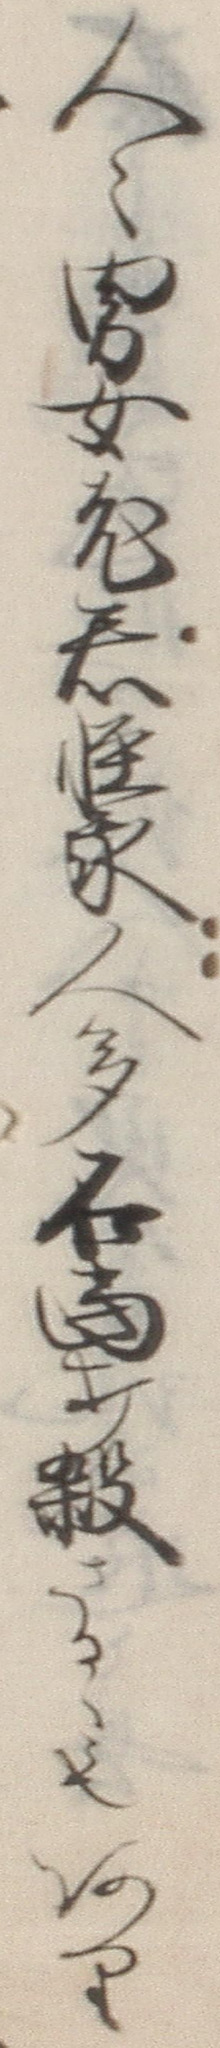人々男女老若怪我人多石当打殺さる者あり
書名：[諸国災害記録]
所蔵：東京大学地震研究所図書室 Earthquake Research Institute Library, The University of Tokyo, JAPAN
